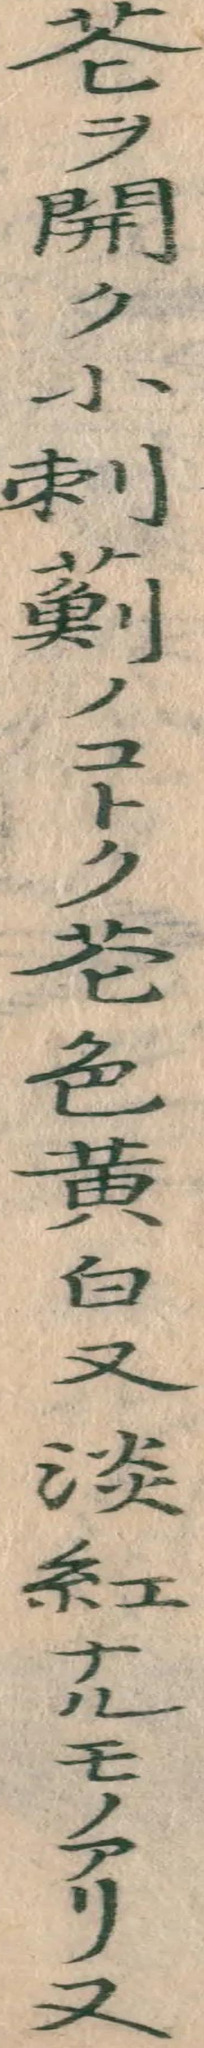花ヲ開ク小刺薊ノコトク花色黄白又淡紅ナルモノアリ又
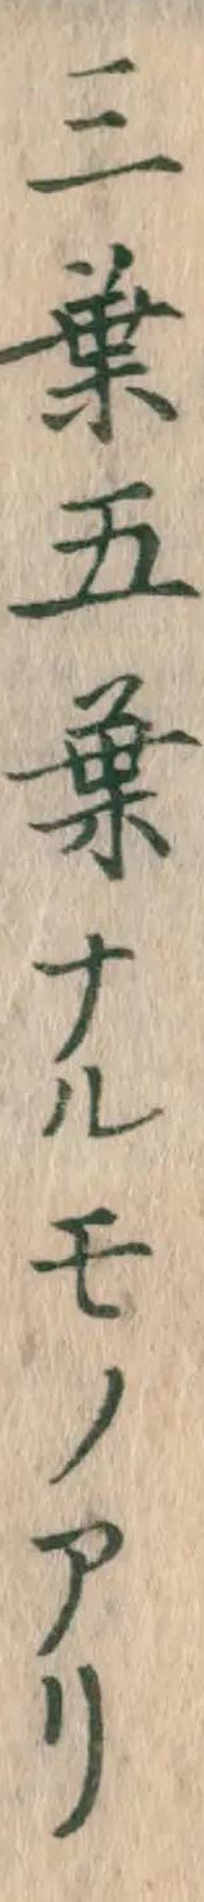三葉五葉ナルモノアリ

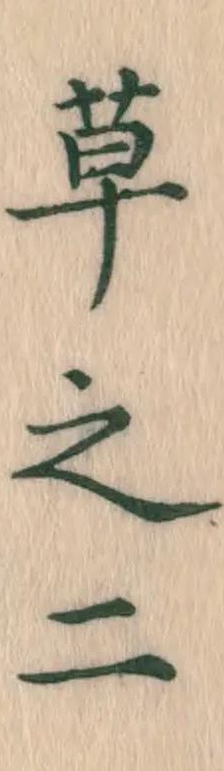草之二

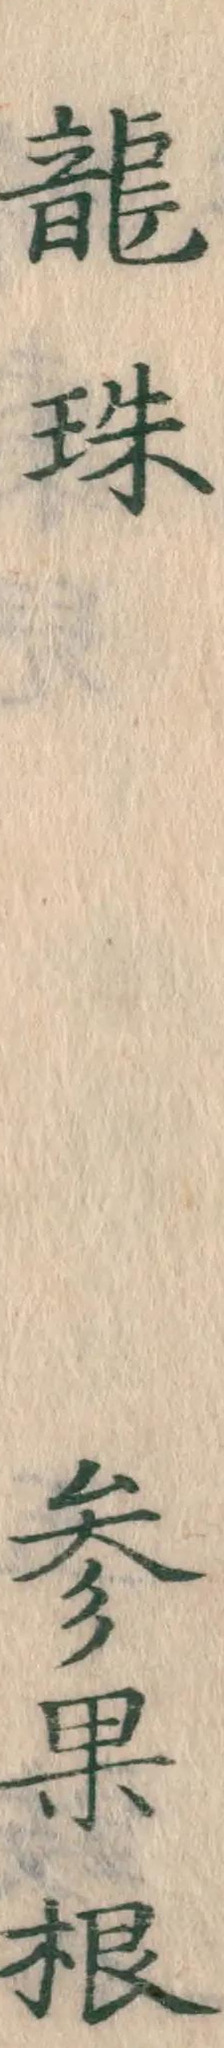竜珠参果根
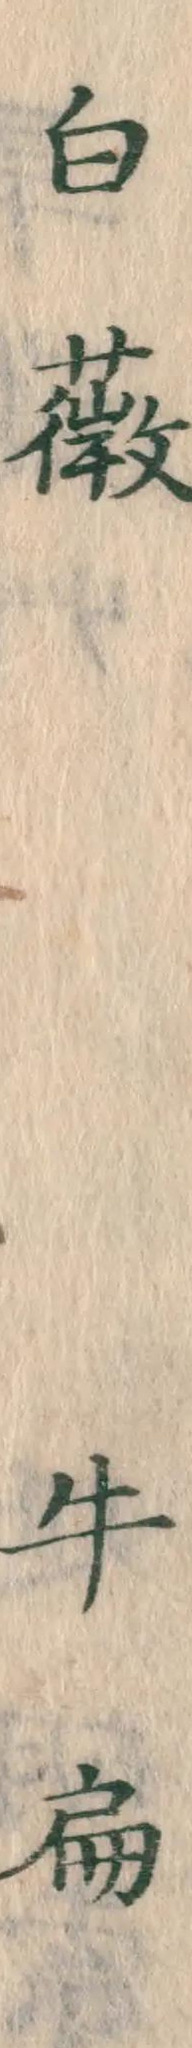白薇牛扁
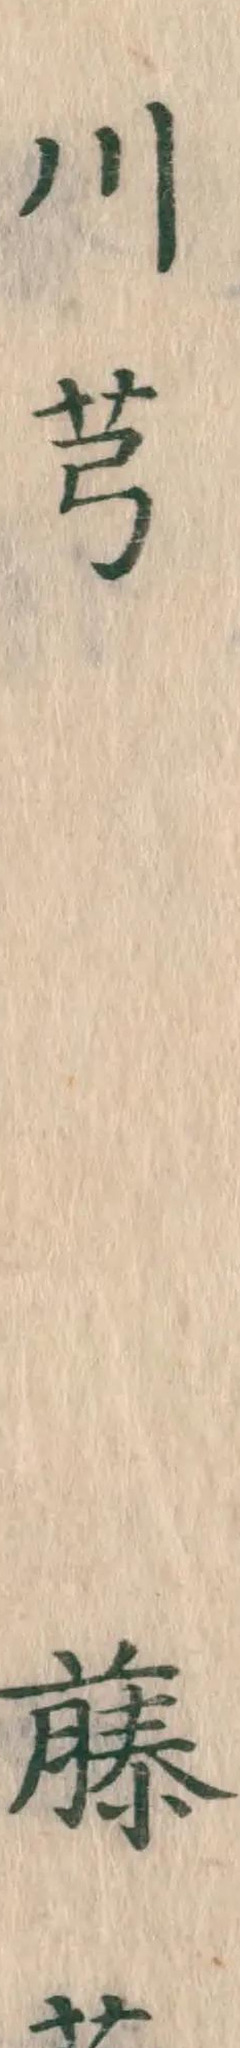川芎藤菊
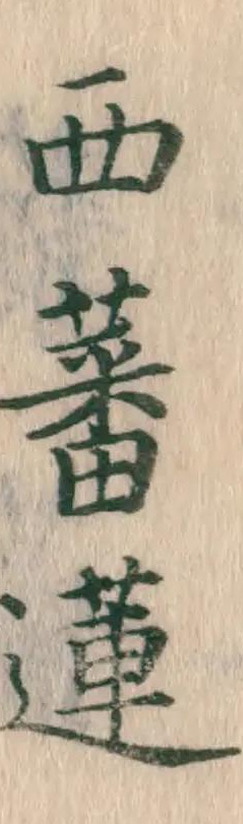西蕃蓮

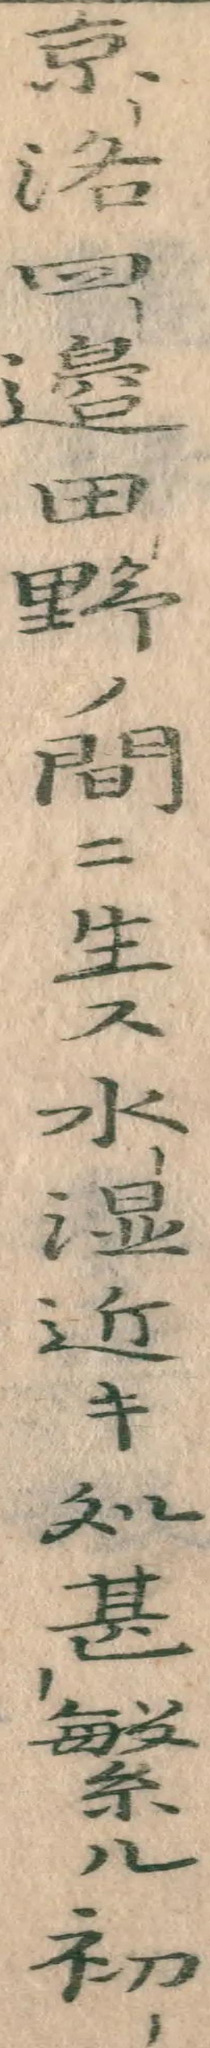京-洛四-辺田-野ノ間ニ生ス水-湿近キ処甚-繁ル初-
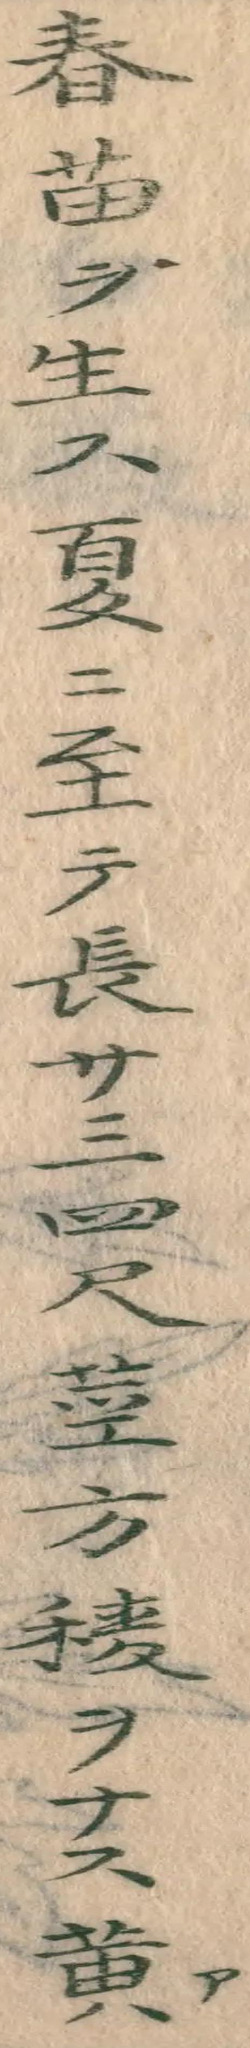春苗ヲ生ス夏ニ至テ長サ三四尺茎方稜ヲナス黄
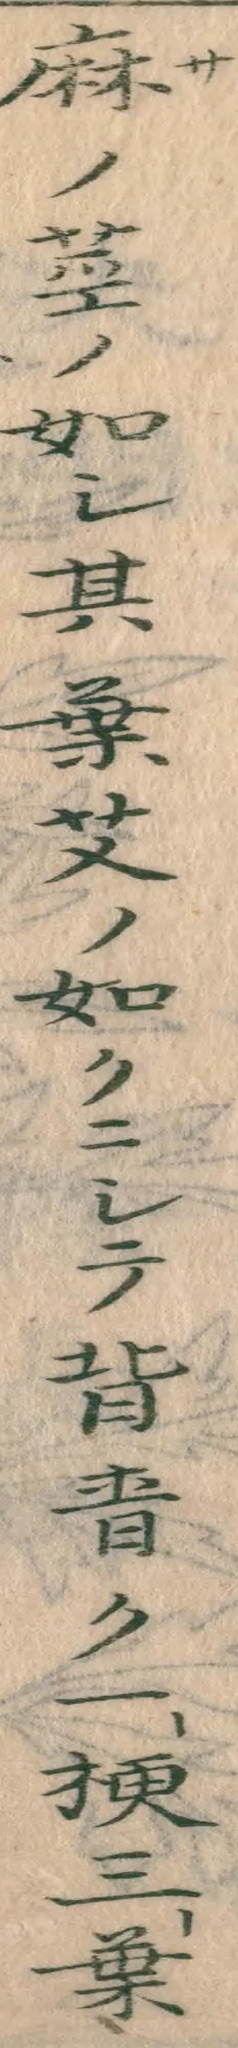麻ノ茎ノ如シ其葉艾ノ如クニシテ背青ク一-梗三-葉
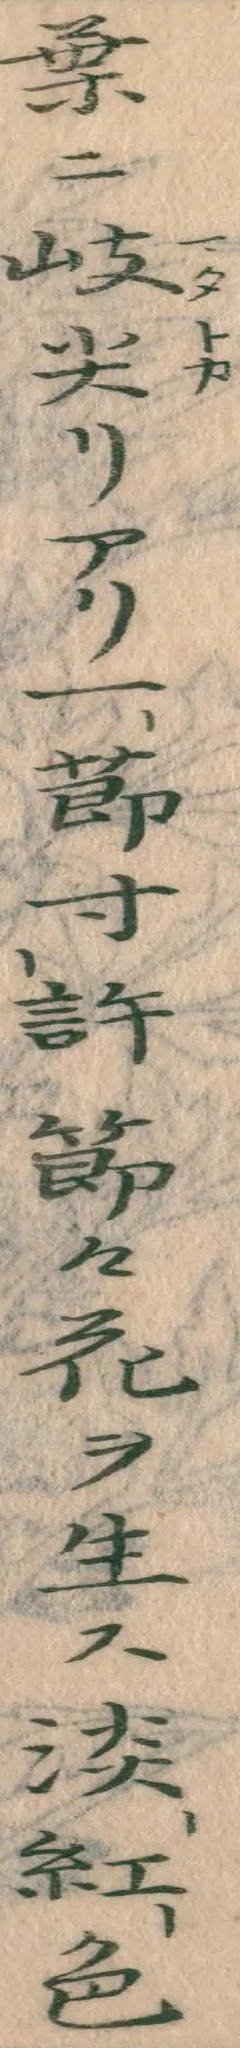葉ニ岐尖リアリ一-節寸-許節々花ヲ生ス淡-紅-色
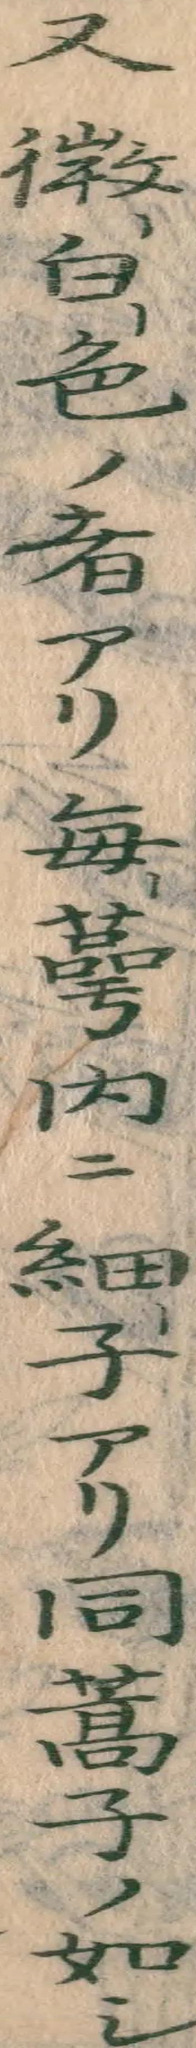又微-白-色ノ者アリ毎-萼内ニ細-子アリ同蒿子ノ如シ
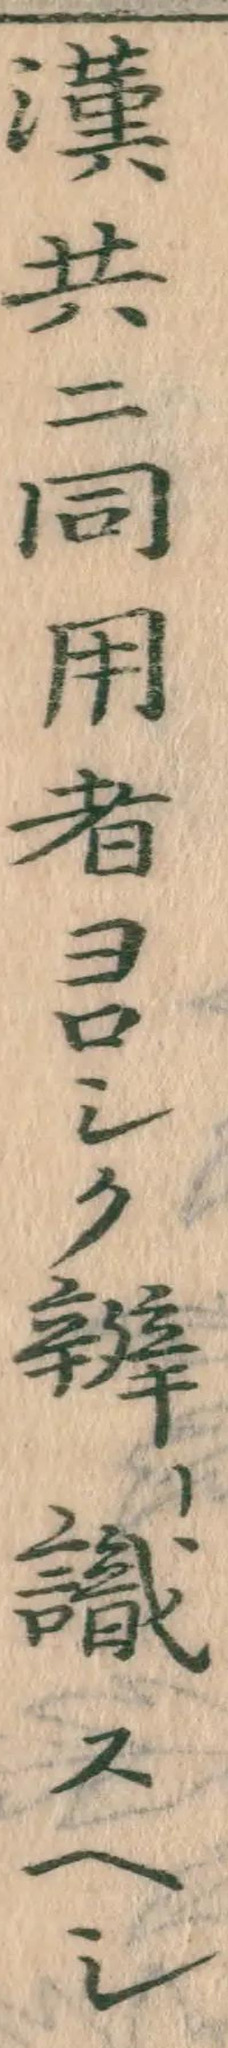漢共ニ同用者ヨロシク弁-識スヘシ
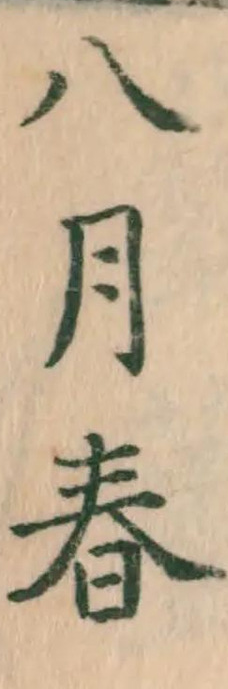八月春

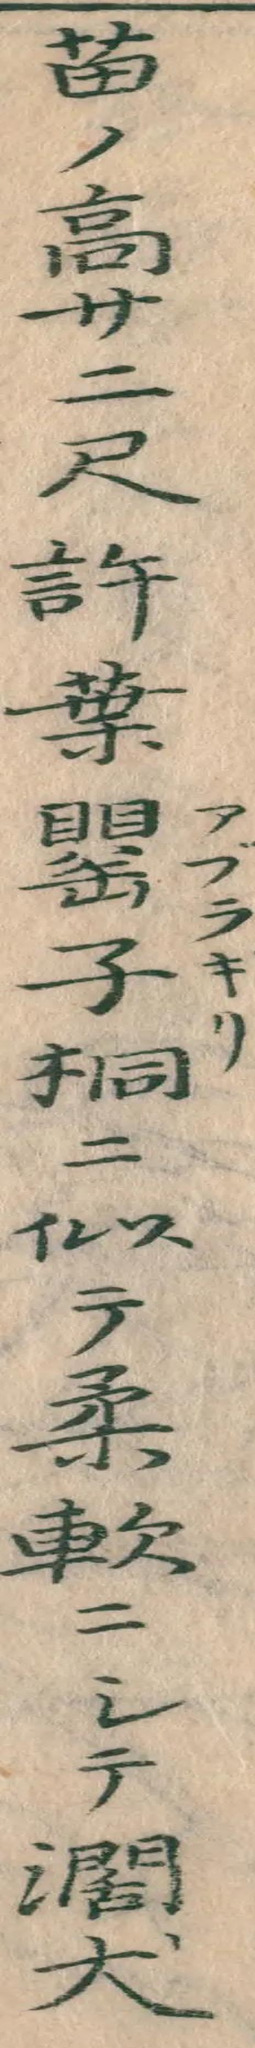苗ノ高サ二尺許葉罌子桐ニ似テ柔軟ニシテ闊-大
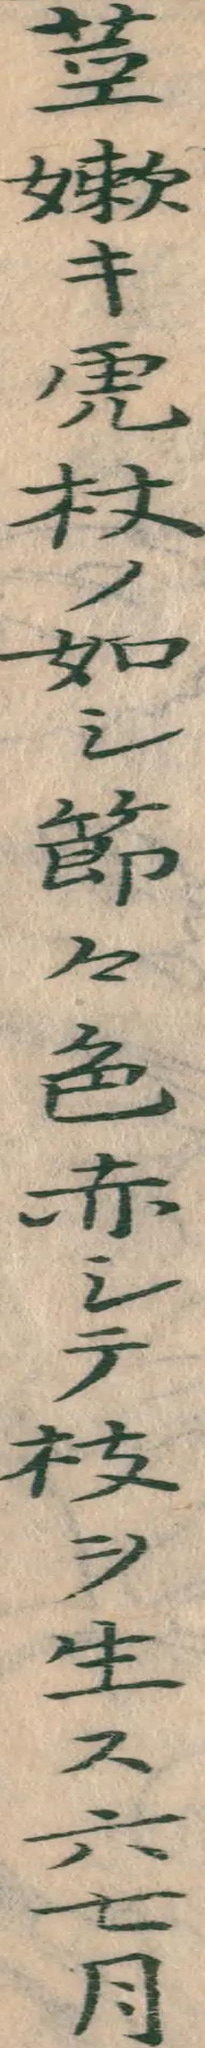茎嫩キ虎杖ノ如シ節々色赤シテ枝ヲ生ス六七月
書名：花彙 草部4巻木部4巻. [1]
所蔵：国立国会図書館 National Diet Library, JAPAN
